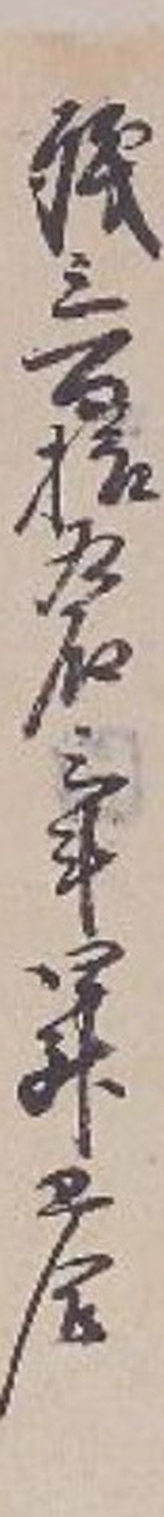残三百拾九石三斗四升五合
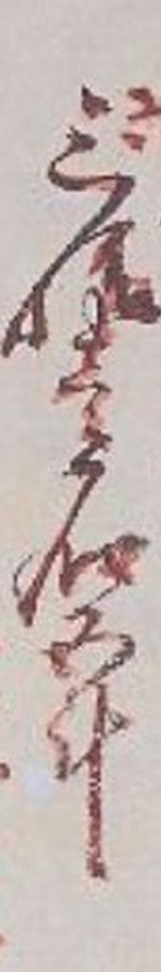「三拾壱石五斗
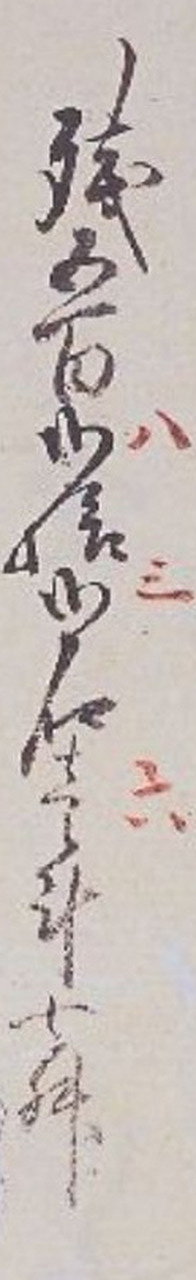残五百弐拾弐石壱斗七升
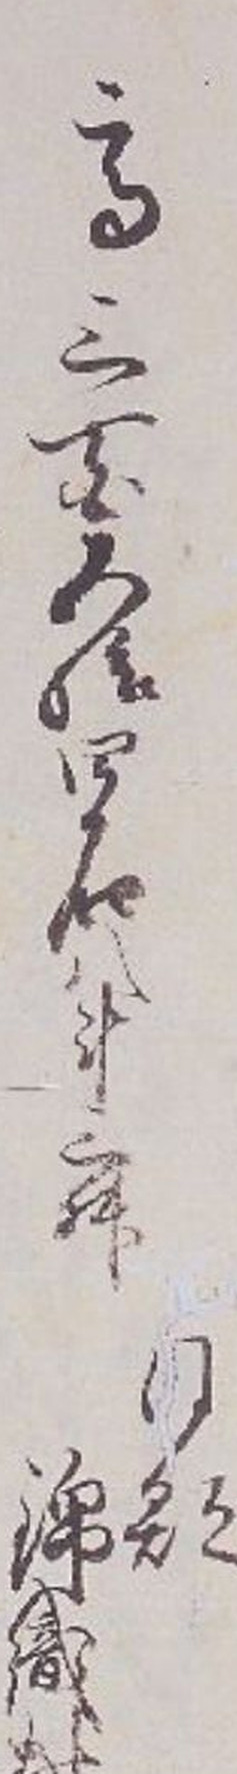高三百五拾四石八斗三升同郡
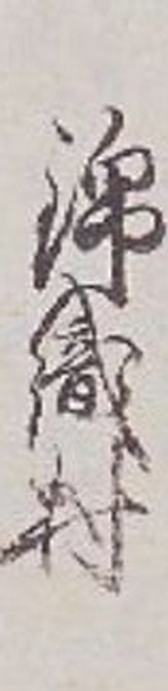錦織村
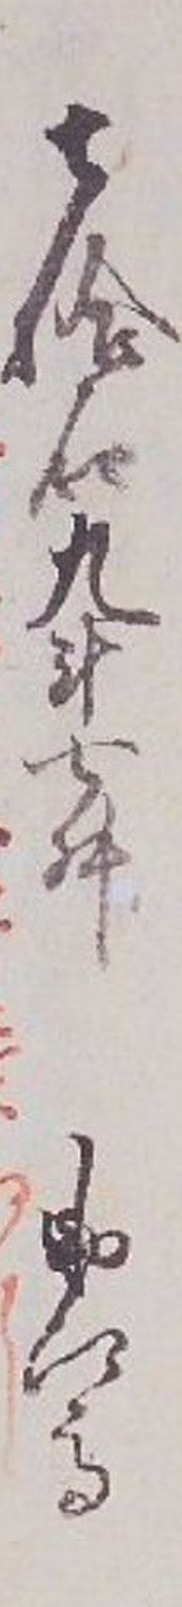七拾石九斗七升助郷高
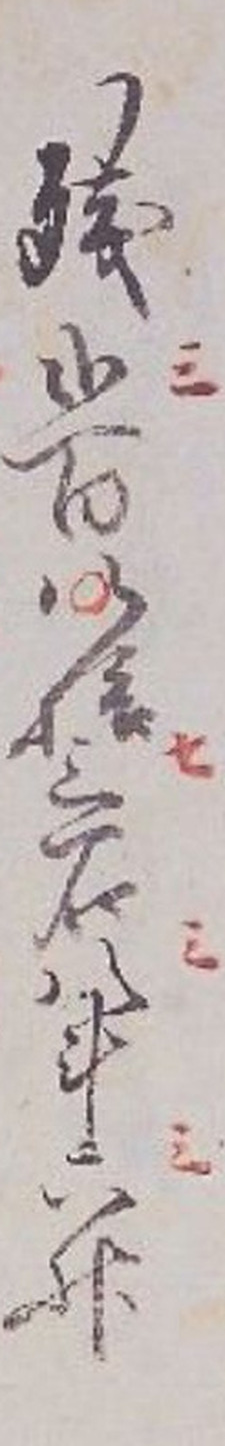残弐百八拾三石八斗六升

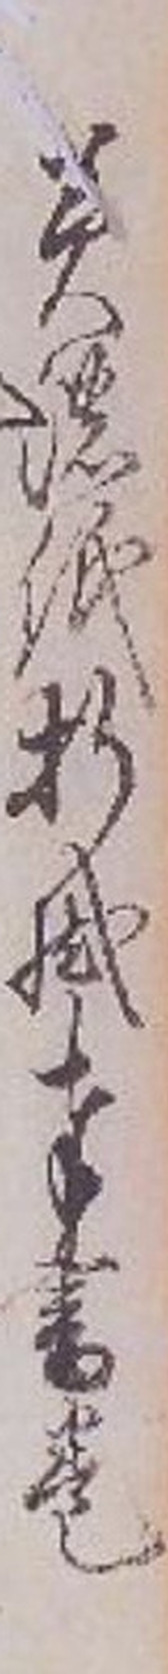美濃紙折掛奉書
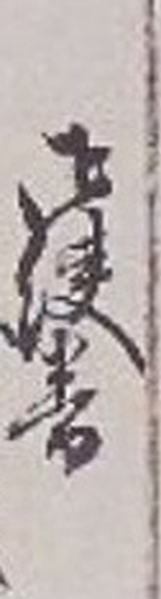御使番
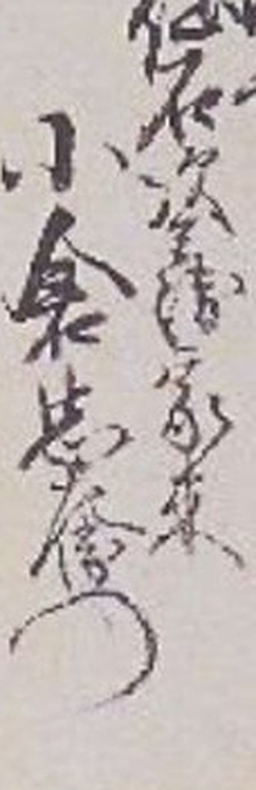小倉忠左衛門
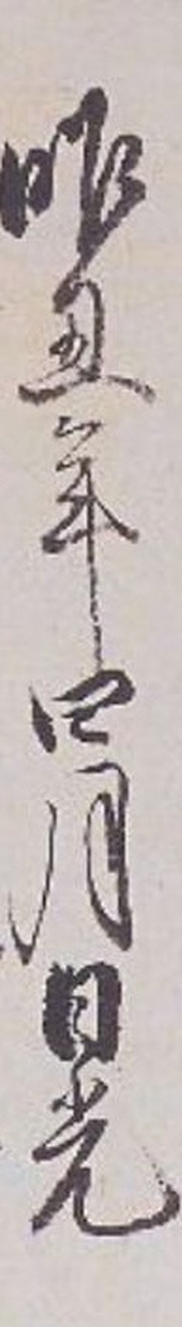昨丑年四月日光
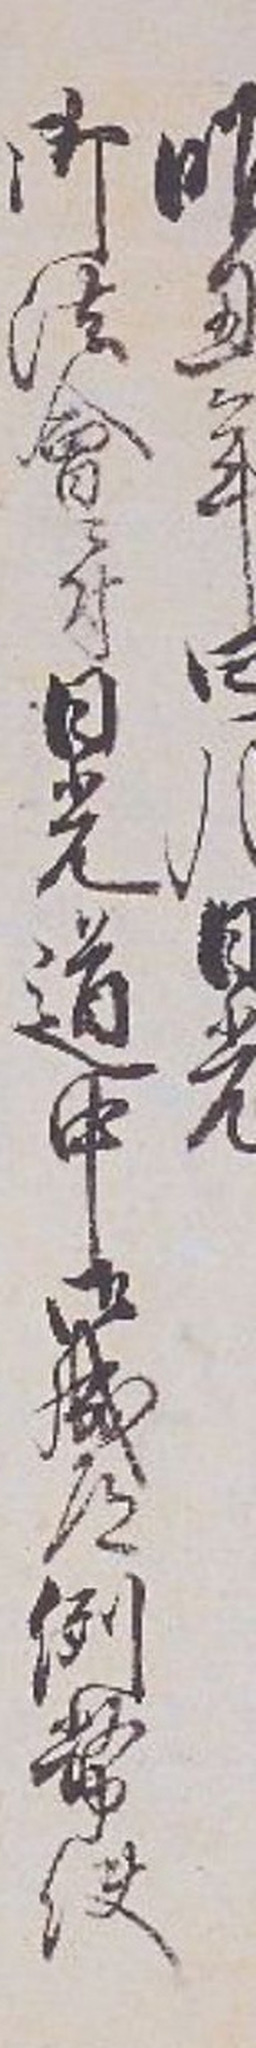御法会に付日光道中御成道例幣使
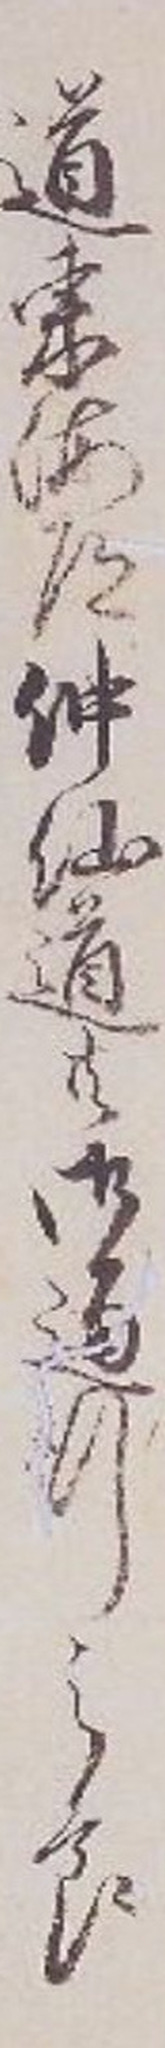道東海道仲仙道共御通行之節
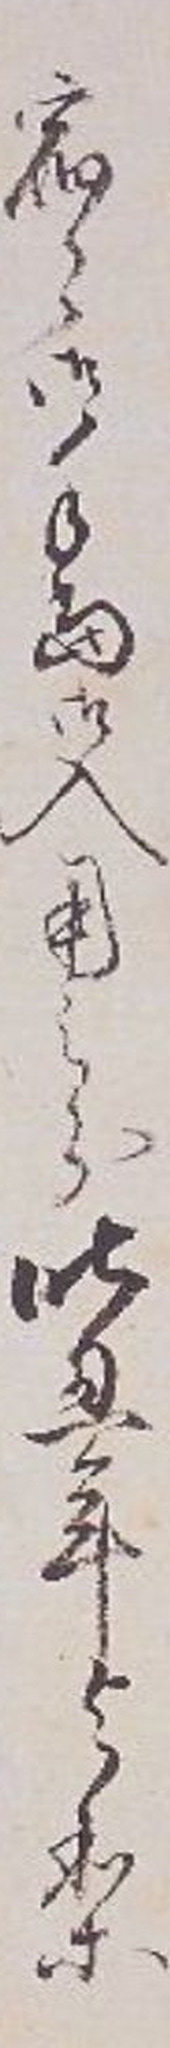宿々御手当御入用之分昨丑年より
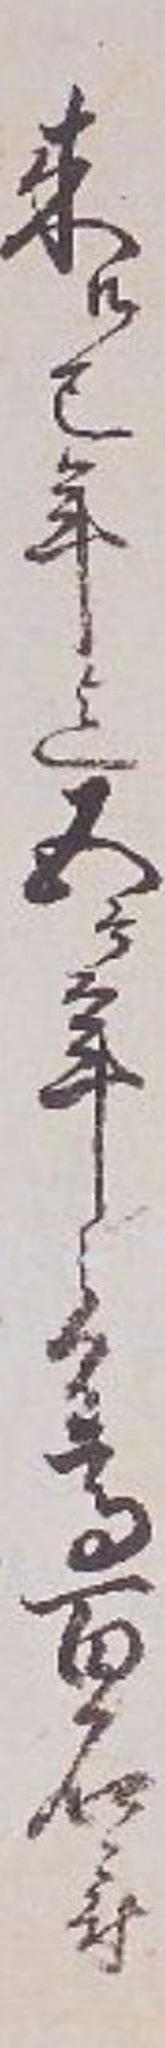来る巳年迠五ヶ年高百石に付
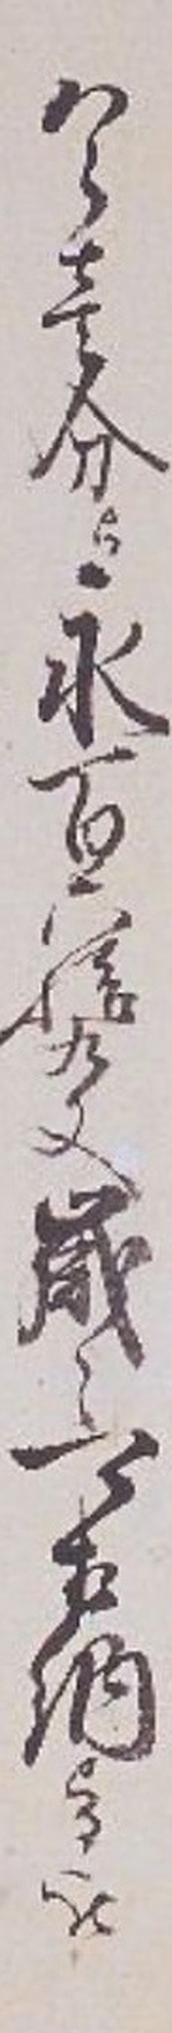壱分と永百拾九文歳々可相納旨被
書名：琉球人帰国に付国役金の記録
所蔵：University of the Ryukyus Library
